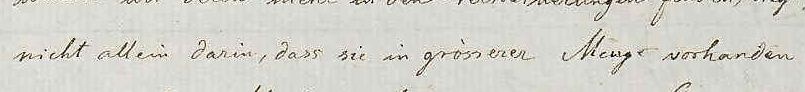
nicht allein darin, dass sie in grösserer Menge vorhanden
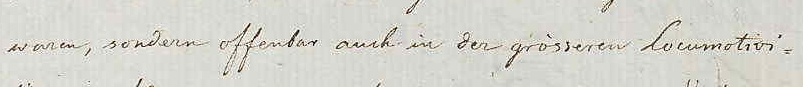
waren, sondern offenbar auch in der grösseren Locumotivi-
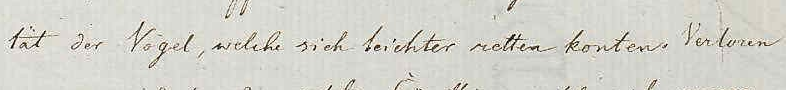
tät der Vögel, welche sich leichter retten konten. Verloren
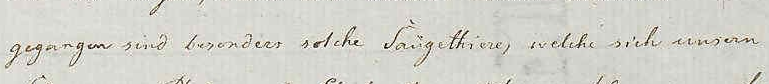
gegangen sind besonders solche Säugethiere, welche sich unsern
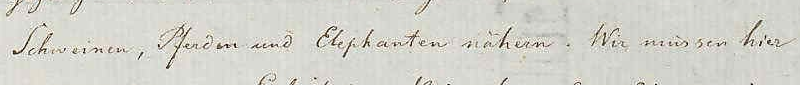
Schweinen, Pferden und Elephanten nähern. Wir müssen hier
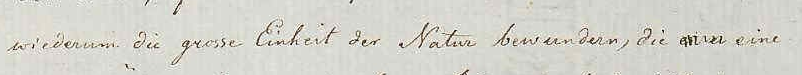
wiederum die grosse Einheit der Natur bewundern, die einereine
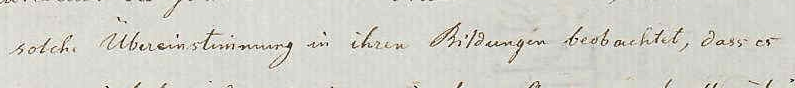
solche Übereinstimmung in ihren Bildungen beobachtet, dass es
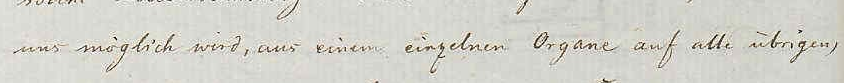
uns möglich wird, aus einem einzelnen Organe auf alle übrigen,
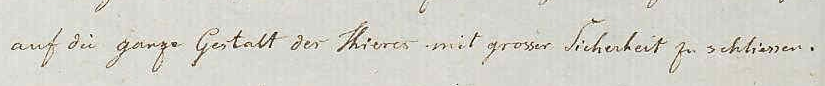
auf die ganze Gestalt des Thieres mit grosser Sicherheit zu schliessen.
